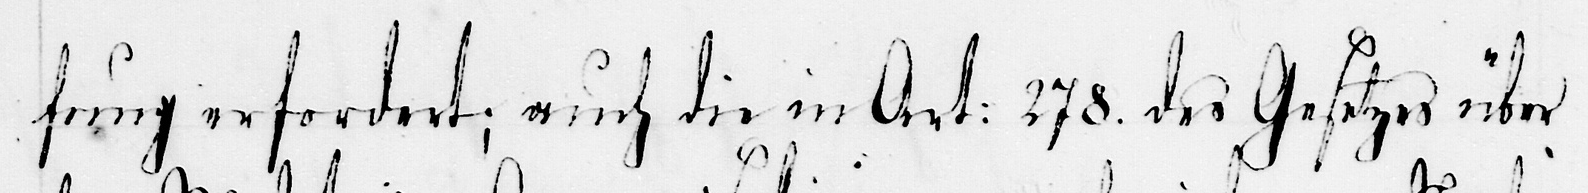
fung erfordert; auch die in Art: 278. des Gesetzes über
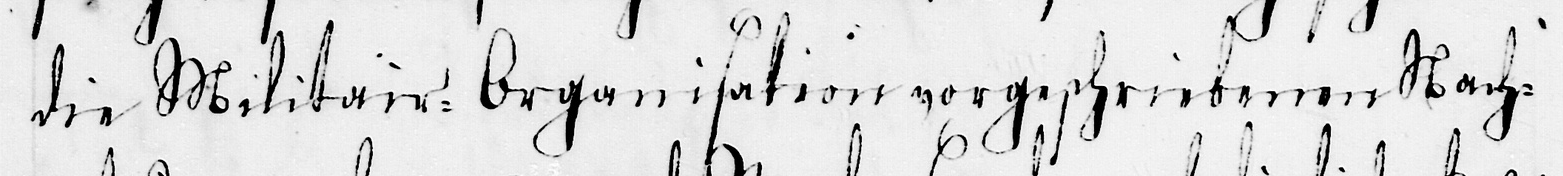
die Militair-Organisation vorgeschriebenen Nach¬
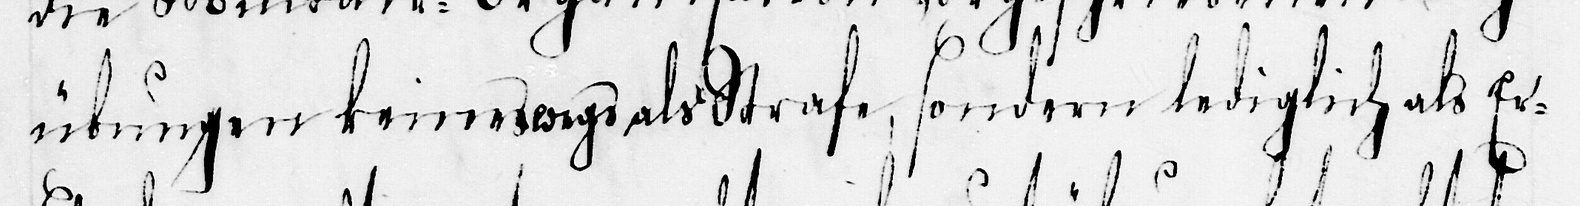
übungen keineswegs als Strafe, sondern lediglich als Er¬
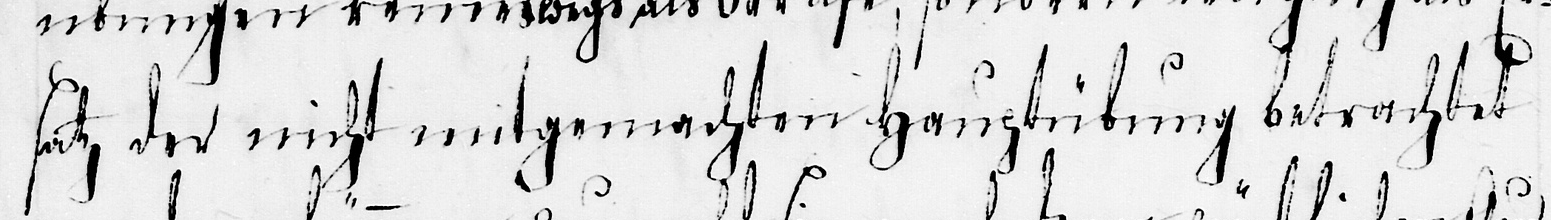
satz der nicht mitgemachten Hauptübung betrachtet
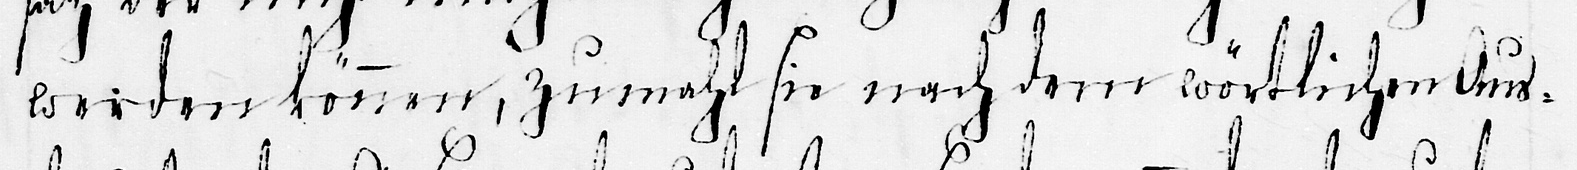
werden können, zumahl sie nach dem wörtlichen Aus¬
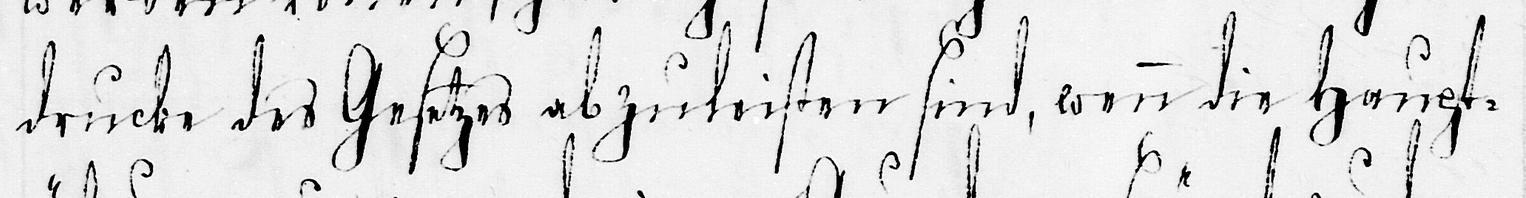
drucke des Gesetzes abzuleisten sind, wenn die Haupt¬
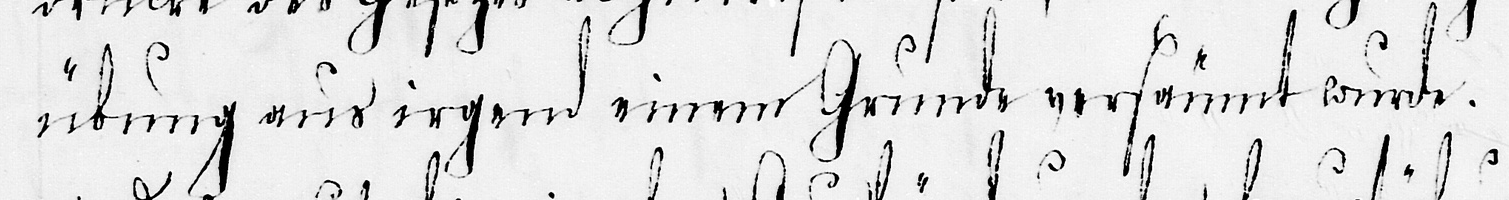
übung aus irgend einem Grunde versäumt wurde.
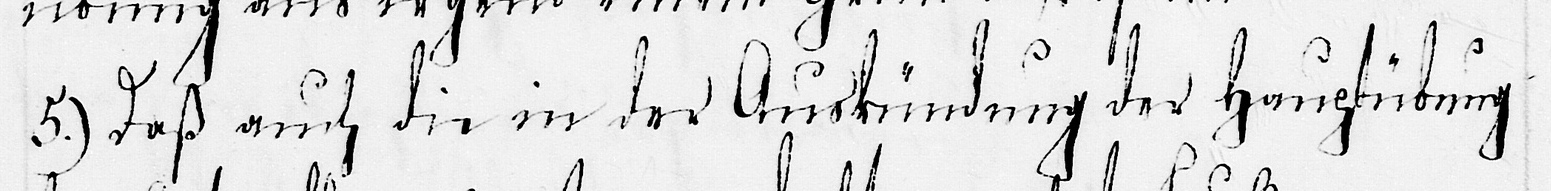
5.) Daß auch die in der Auskündung der Hauptübung
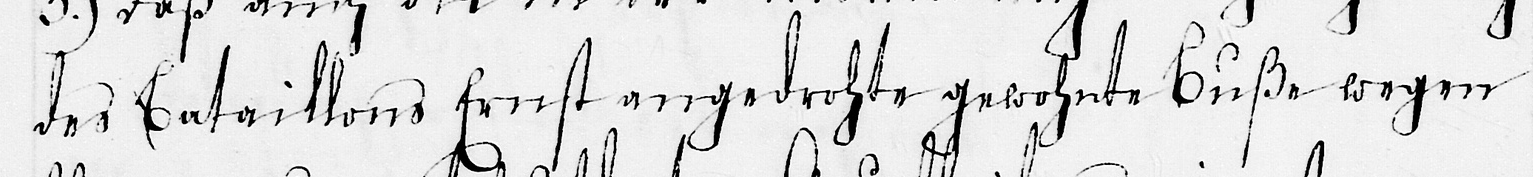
des Bataillons Ernst angedrohte gewohnte Buße wegen
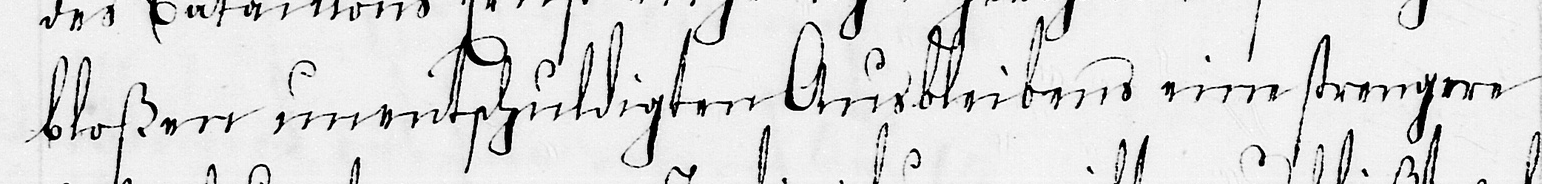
bloßen unentschuldigten Ausbleibens eine strengere
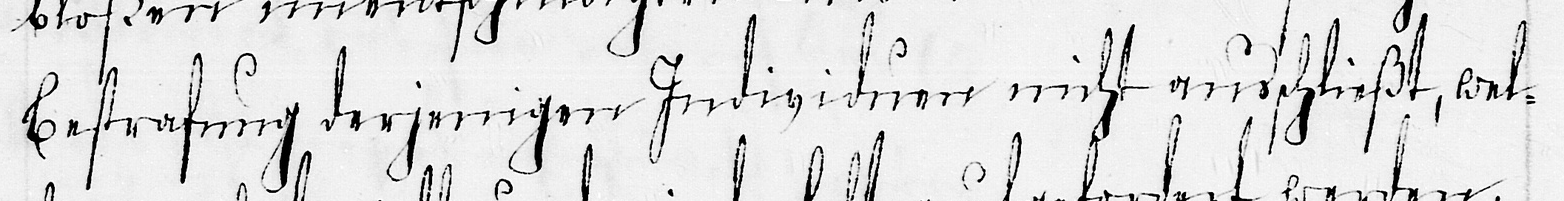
Bestrafung derjenigen Individuen nicht ausschließt, wel¬
